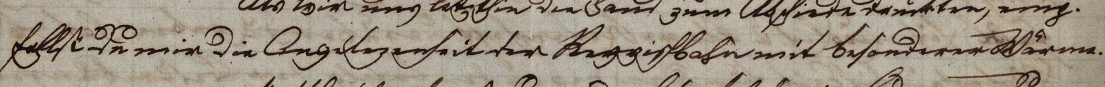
fahlst Du mir die Angelegenheit der Reppischbahn mit besonderer Wärme.
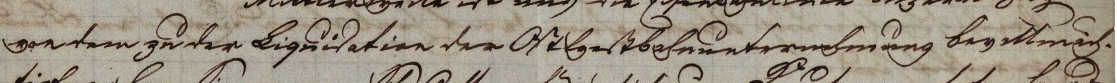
von dem zu der Liquidation der Ostwestbahnunternehmung bevollmäch-
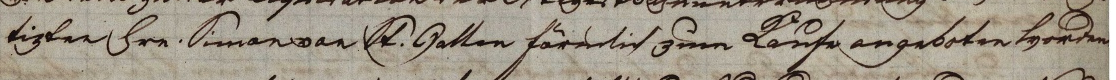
tigten Hrn. Simon von St. Gallen förmlich zum Kaufe angeboten worden.
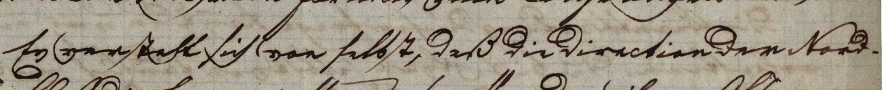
Es versteht sich von selbst, daß die Direction der Nord-
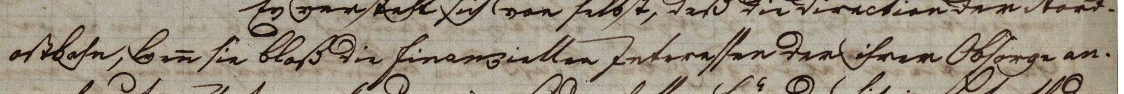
ostbahn, wenn sie bloß die finanziellen Interessen der ihrer Obsorge an-
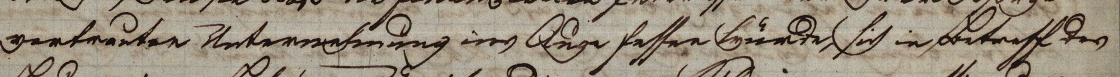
vertrauten Unternehmung ins Auge fassen würde, sich in Betreff des
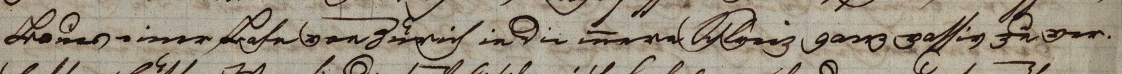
Baues einer Bahn von Zürich in die innere Schweiz ganz passiv zu ver-
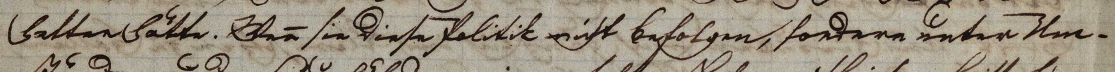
halten hätte. Wenn sie diese Politik nicht befolgen, sondern unter Um-
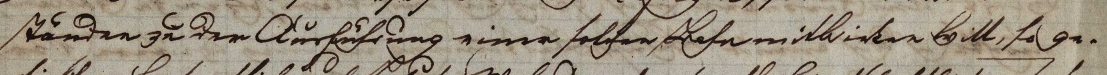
ständen zu der Ausführung einer solchen Bahn mitwirken will, so ge-
